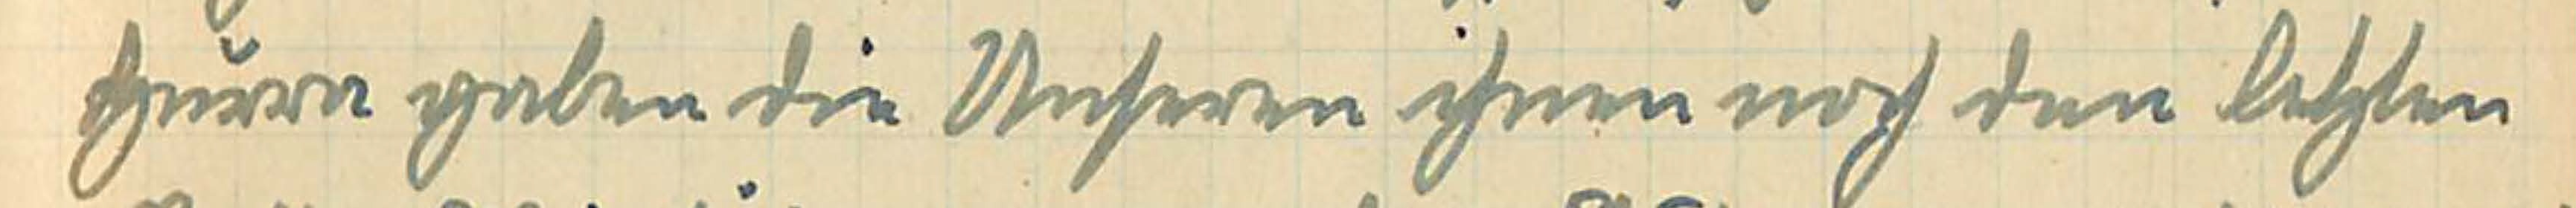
Hurra gaben die Unseren ihnen noch den letzten
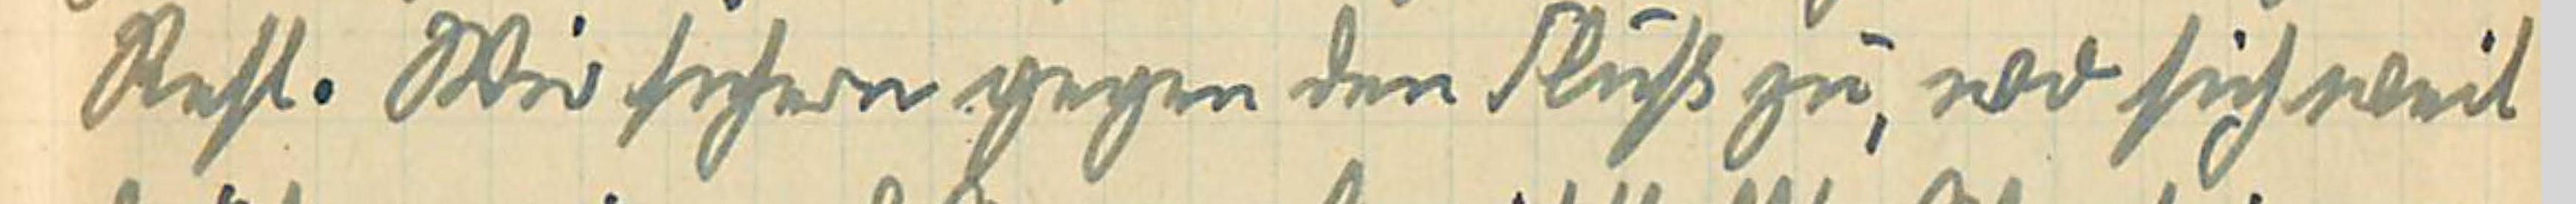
Rest. Wir sichern gegen den Fluß zu, wo sich weit
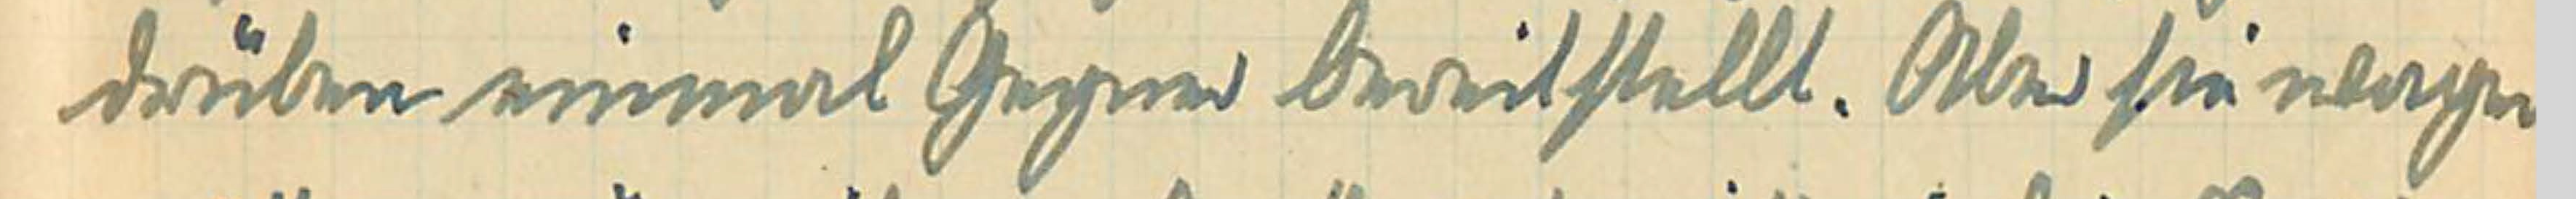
drüben einmal Gegner bereitstellt. Aber sie wagen
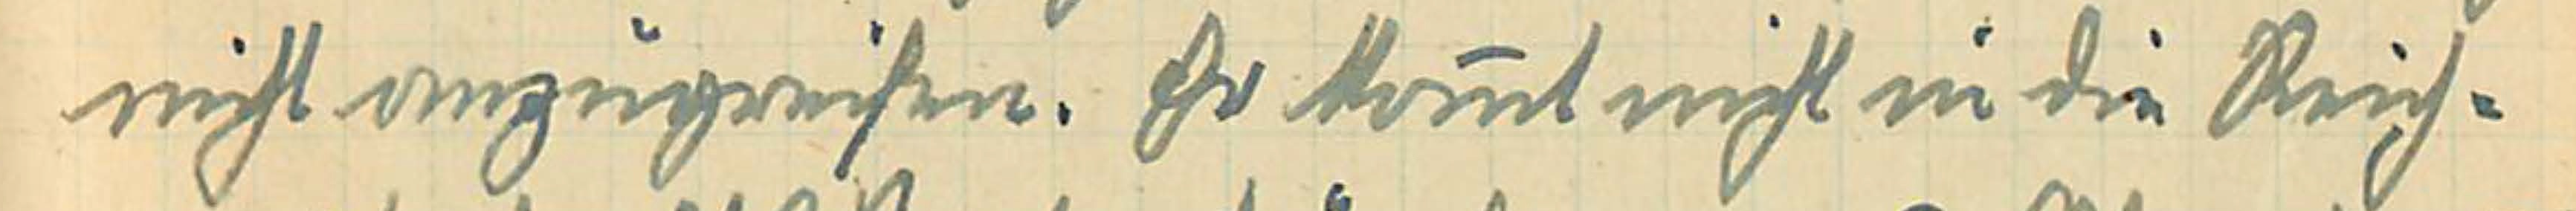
nicht anzugreifen. Er kommt nicht in die Reich-
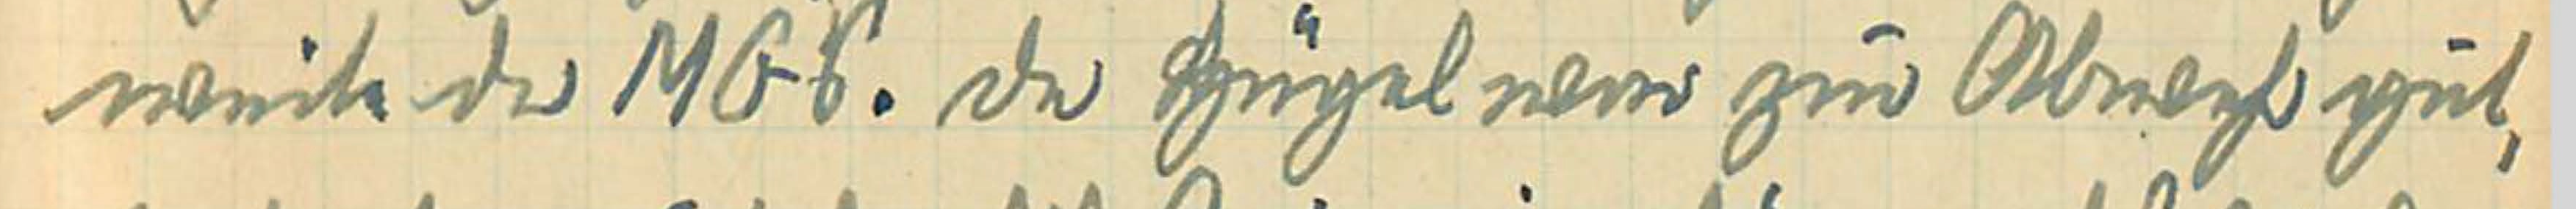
weite der MG’s. Der Hügel war zur Abwehr gut,
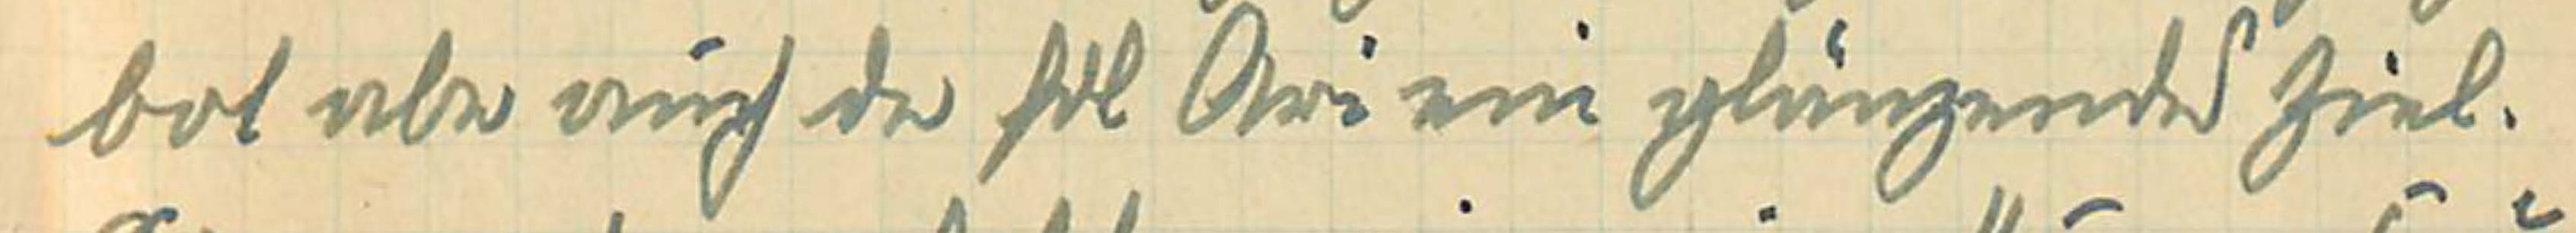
bot aber auch der fdl. Ari ein glänzendes Ziel.
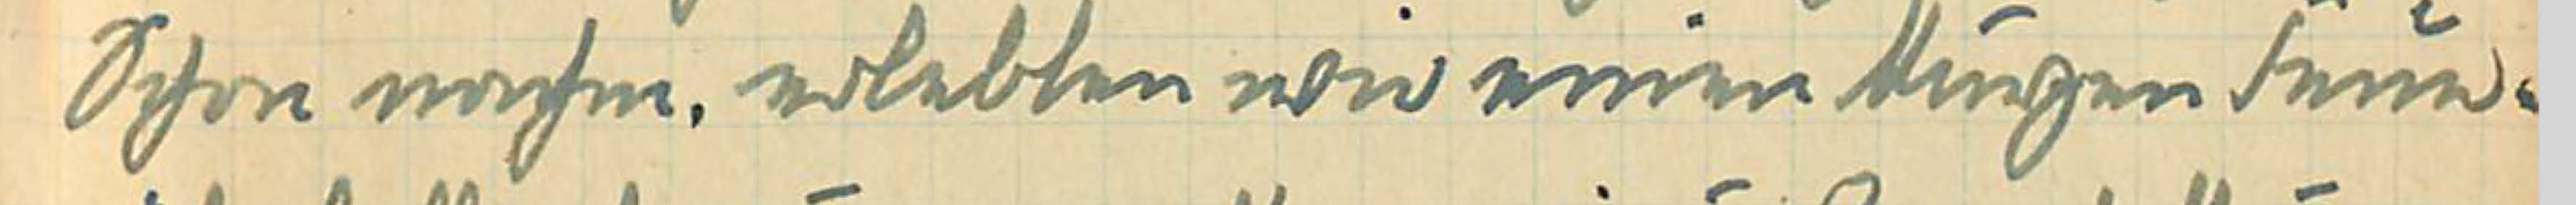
Schon nachm. erlebten wir einen kurzen Feuer-
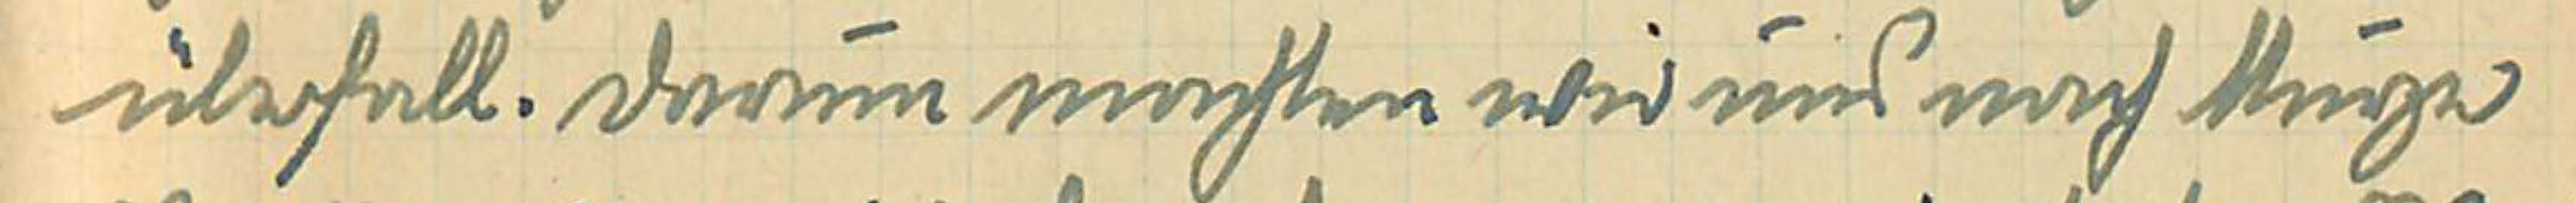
überfall. Darum machten wir uns nach kurzer
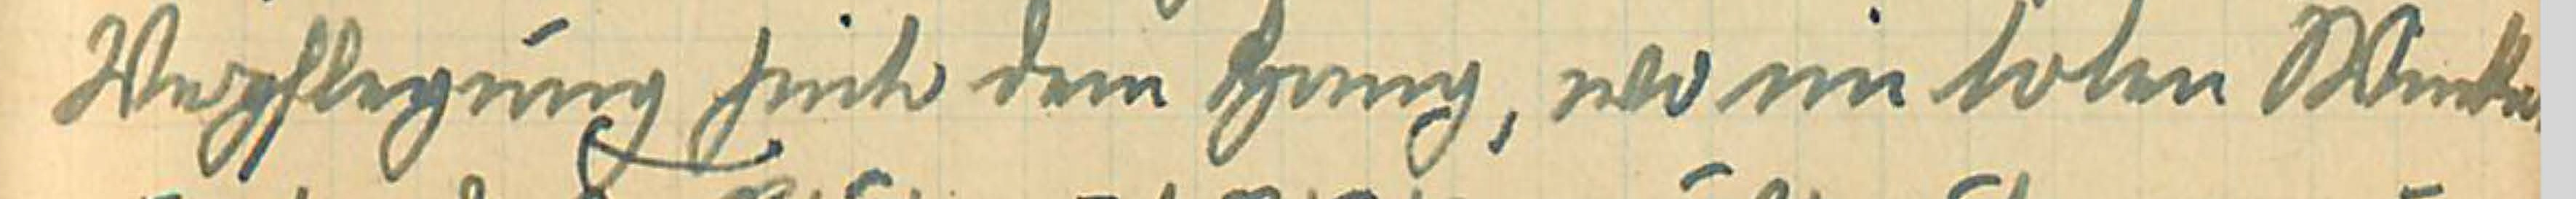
Verpflegung hinter dem Hang, wo im toten Winkel
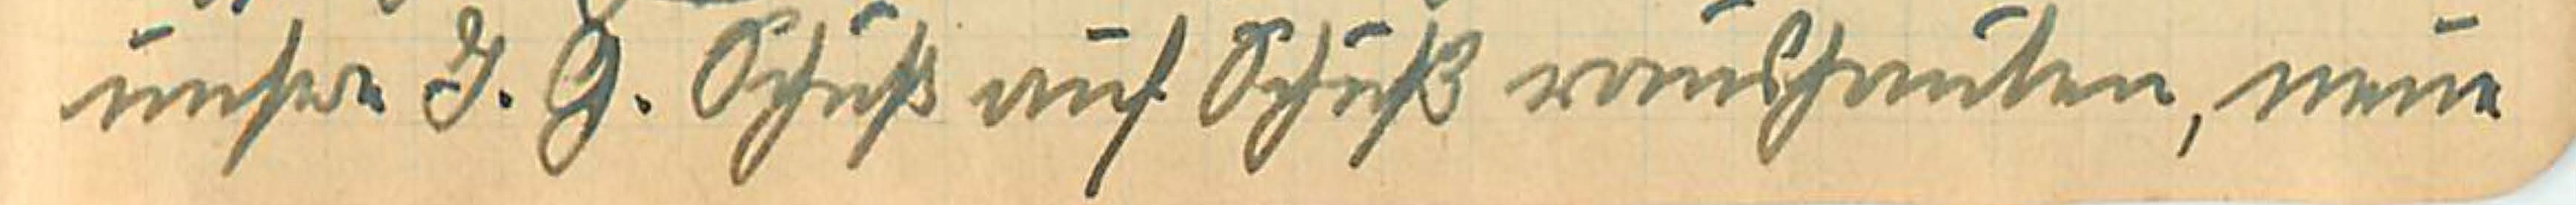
unsere I.G. Schuß auf Schuß raushauten, neue
